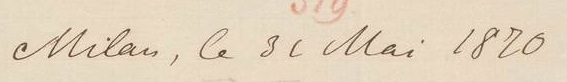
Milan, le 31 Mai 1870
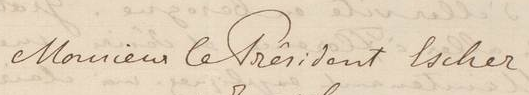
Monsieur le Président Escher
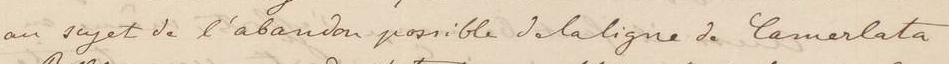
au sujet de l'abandon possible de la ligne de Camerlata
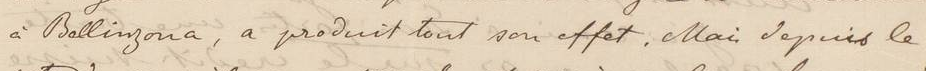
à Bellinzona, a produit tout son effet. Mais depuis le
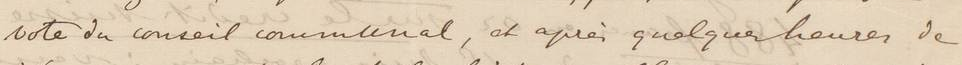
vote du conseil communal, et après quelques heures de
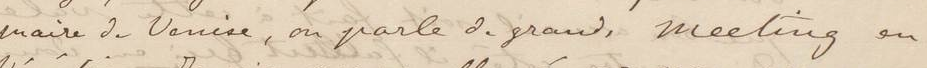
maire de Venise, on parle de grand meeting en
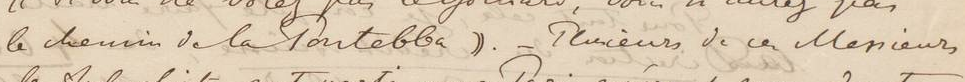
le chemin de la Pontebba». – Plusieurs de ces Messieurs
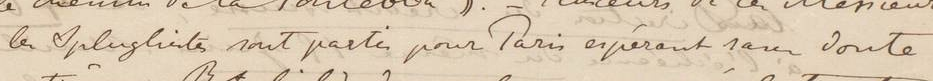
les Splughistes sont partis pour Paris espérant sans doute
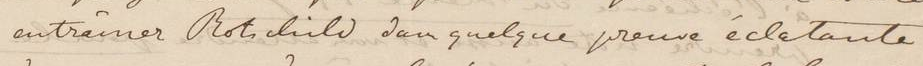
entraîner Rotschild dans quelque preuve éclatante
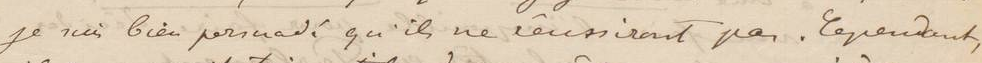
je suis bien persuadé qu'ils ne réussiront pas. Cependant,
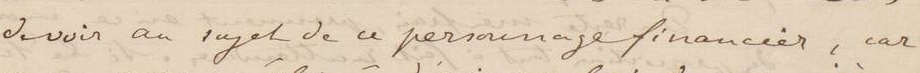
de voir au sujet de ce personnage financier, car
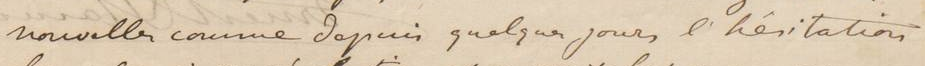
nouvelles comme depuis quelques jours l'hésitation
